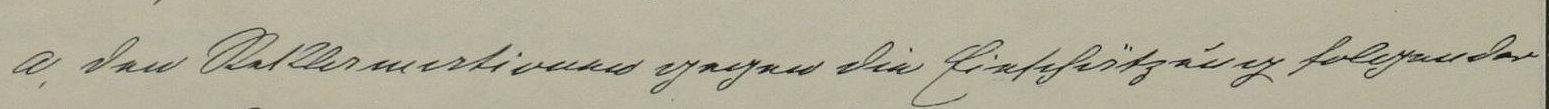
a. den Reklamationen gegen die Einschätzung folgender
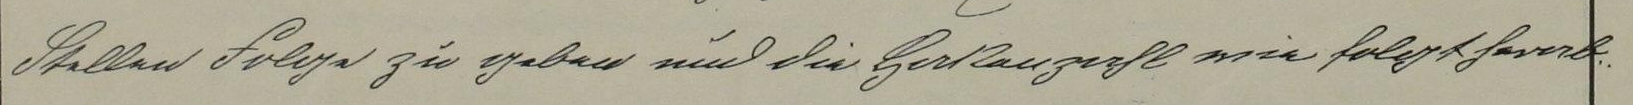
Stellen Folge zu geben und die Hakenzahl wie folgt herab-
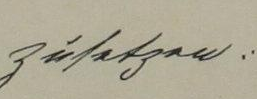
zusetzen:
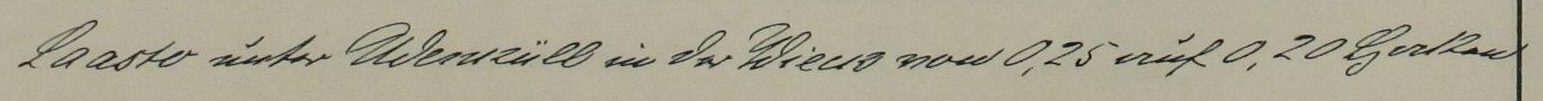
Laasto unter Udenküll in der Wieck von 0,25 auf 0,20 Haken
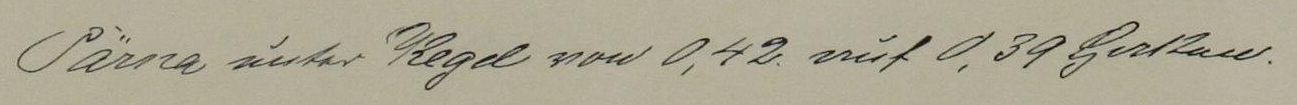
Pärna unter Kegel von 0,42 auf 0,39 Haken.
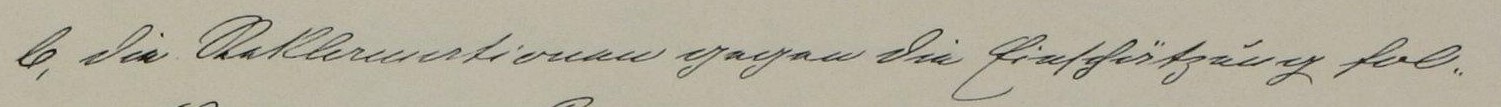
b. die Reklamationen gegen die Einschätzung fol-
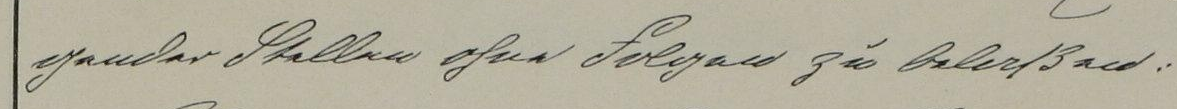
gender Stellen ohne Folgen zu belaßen:
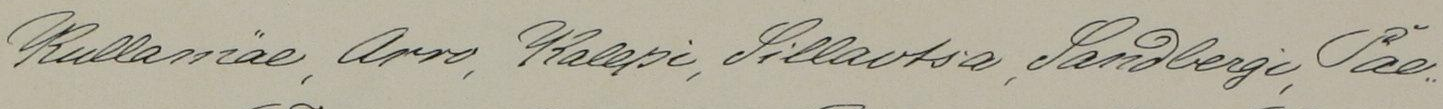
Kullamäe, Arro, Kalepi, Sillaotsa, Sandbergi, Pae-
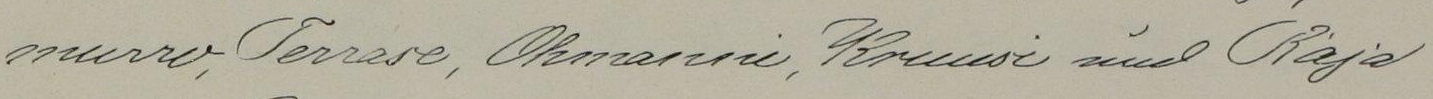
murro, Terrase, Ohmanni, Kruusi und Raja
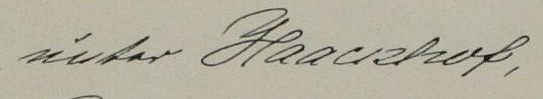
unter Haackhof,
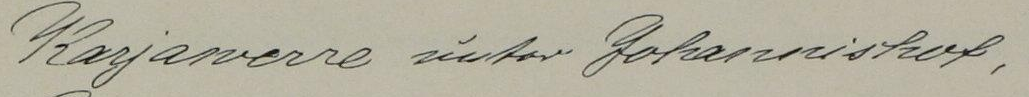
Karjawerre unter Johannishof,
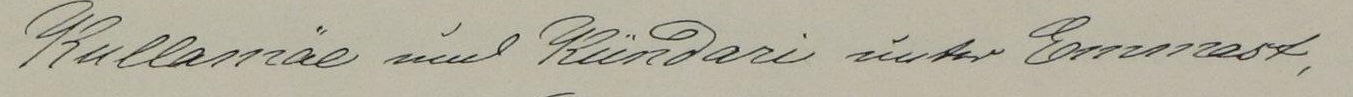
Kullamäe und Kündari unter Emmast,
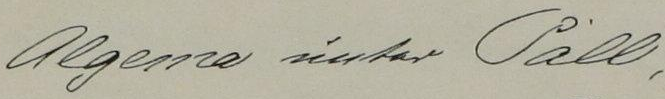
Algema unter Pall,
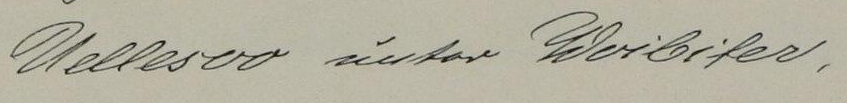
Uellesoo unter Woibifer,
